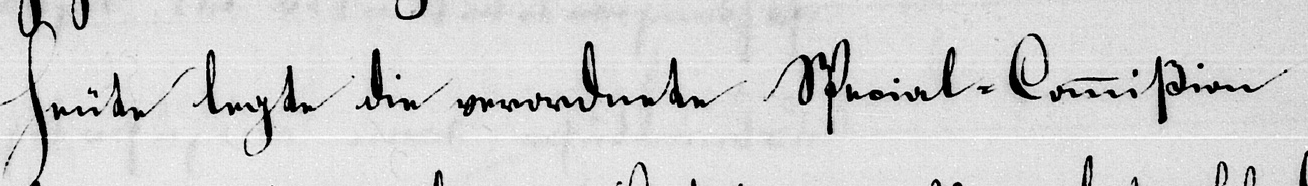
Heute legte die verordnete Special-Commißion
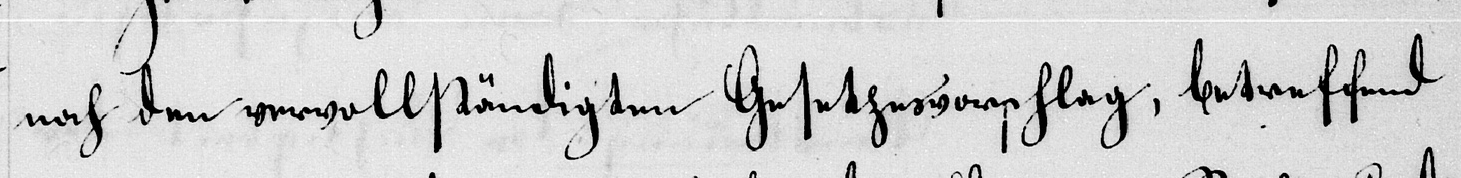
noch den vervollständigten Gesetzesvorschlag, betreffend
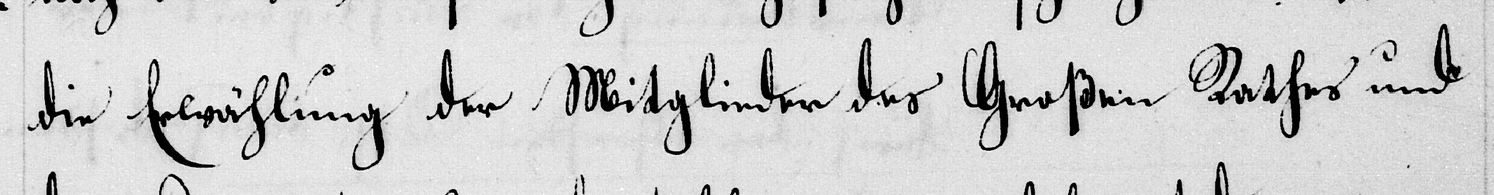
die Erwählung der Mitglieder des Großen Rathes und
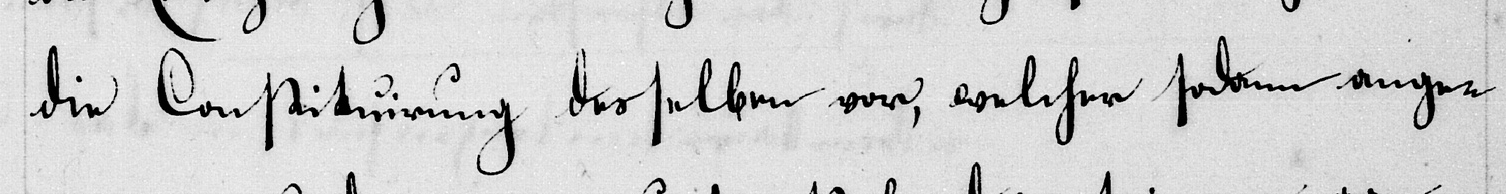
die Constituirung derselben vor, welcher sodann ange¬
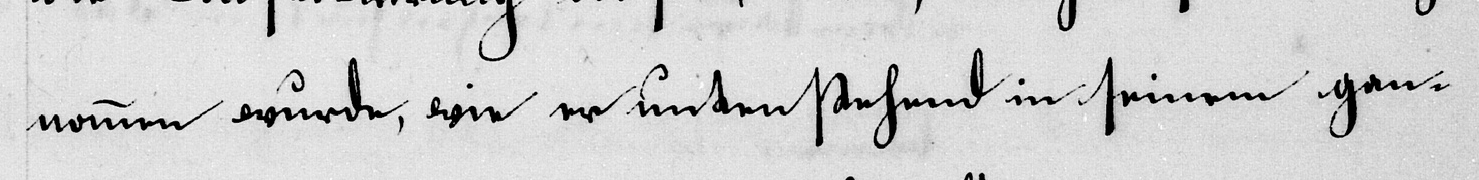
nommen wurde, wie er untenstehend in seinem gan¬
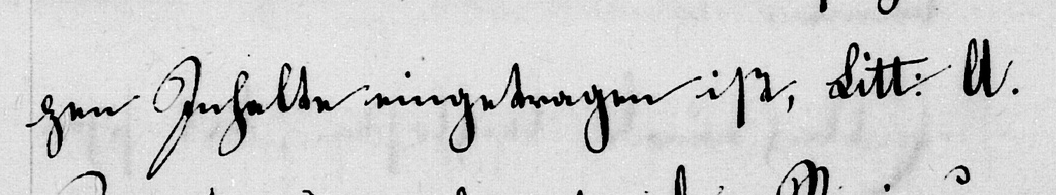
zen Inhalte eingetragen ist, Litt: A.
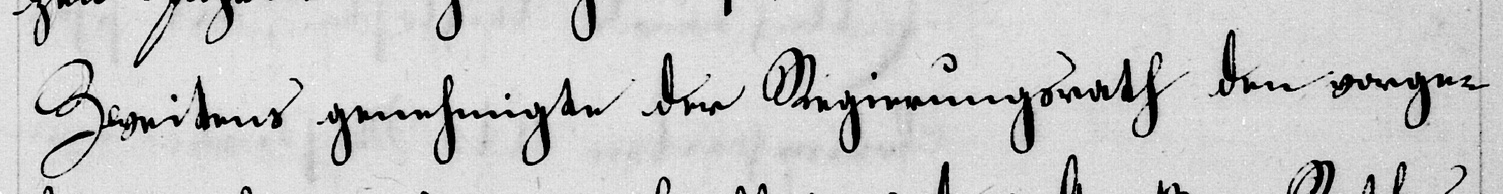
Zweitens genehmigte der Regierungsrath den vorge¬
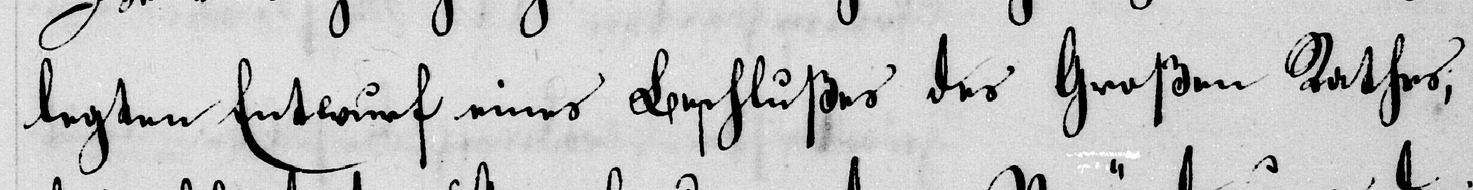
legten Entwurf eines Beschlußes des Großen Rathes,
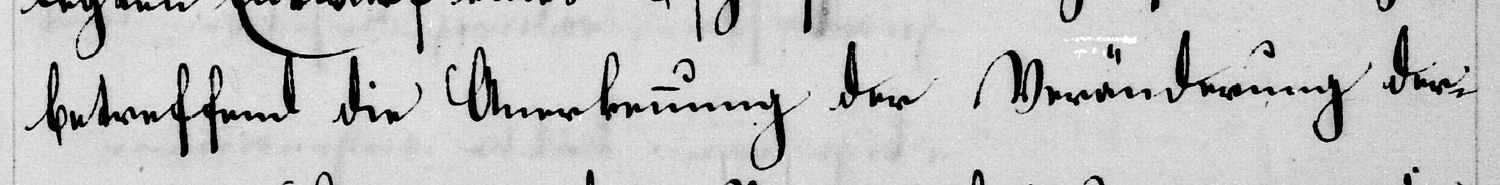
betreffend die Anerkennung der Veränderung der¬
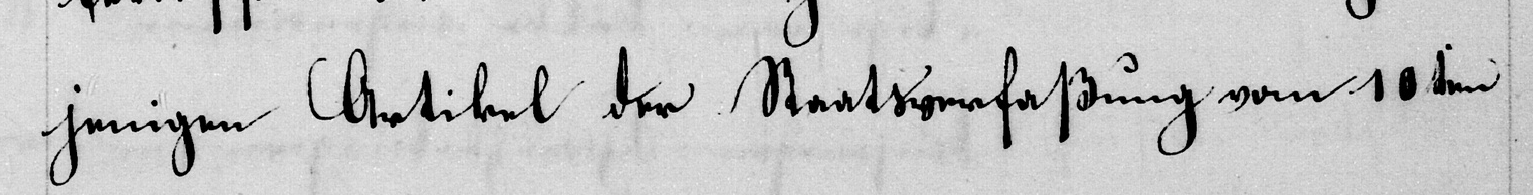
jenigen Artikel der Staatsverfaßung vom 10ten
